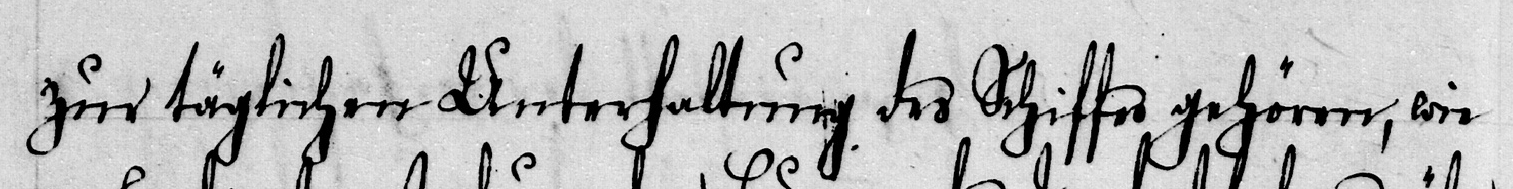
zur täglichen Unterhaltung des Schiffes gehören, wie
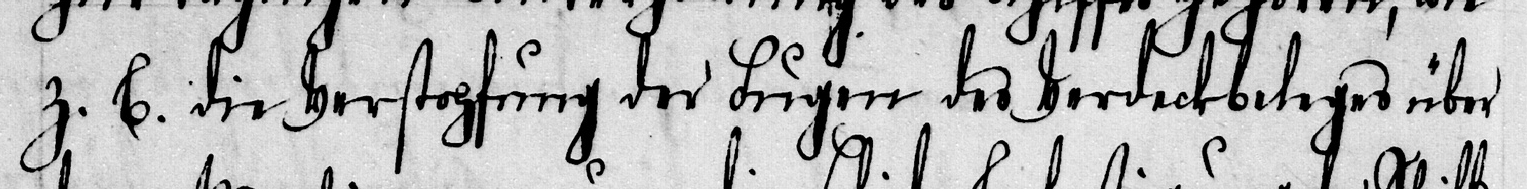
z.B. die Verstopfung der Fugen des Verdeckbeleges über
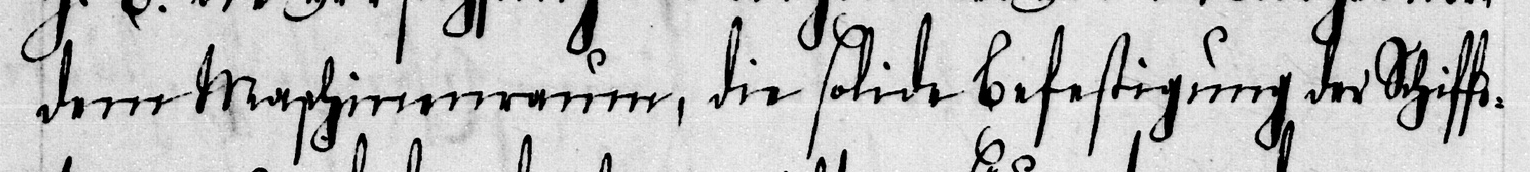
dem Maschinenraum, die solide Befestigung der Schiffs¬
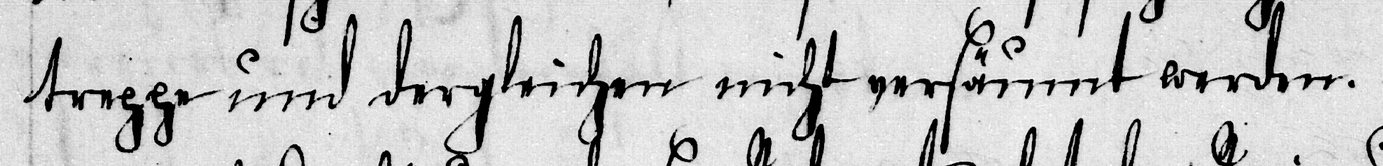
treppe und dergleichen nicht versäumt werden.
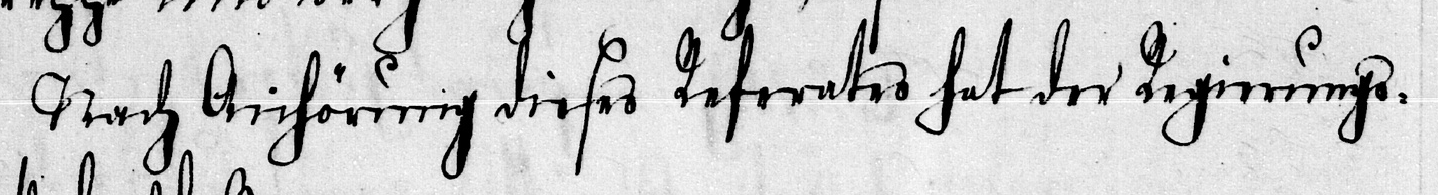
Nach Anhörung dieses Referates hat der Regierungs¬
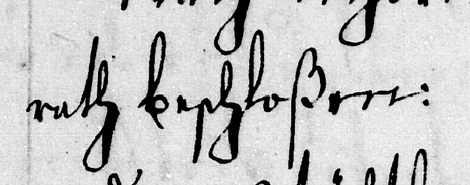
rath beschloßen:
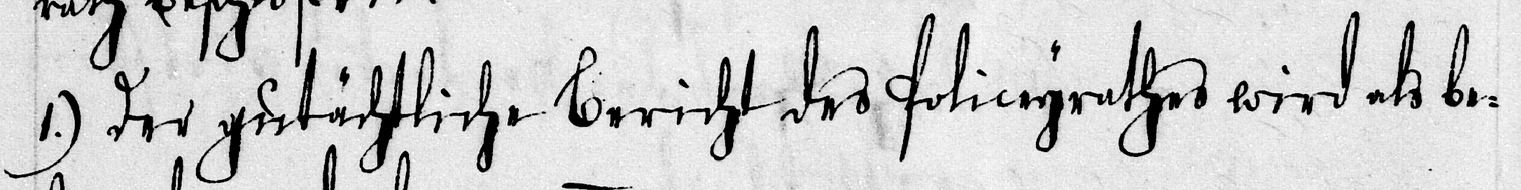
1.) Der gutächtliche Bericht des Policeyrathes wird als be¬
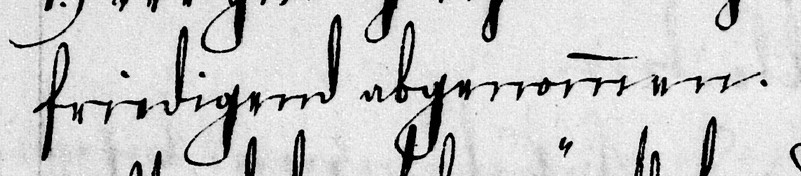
friedigend abgenommen.
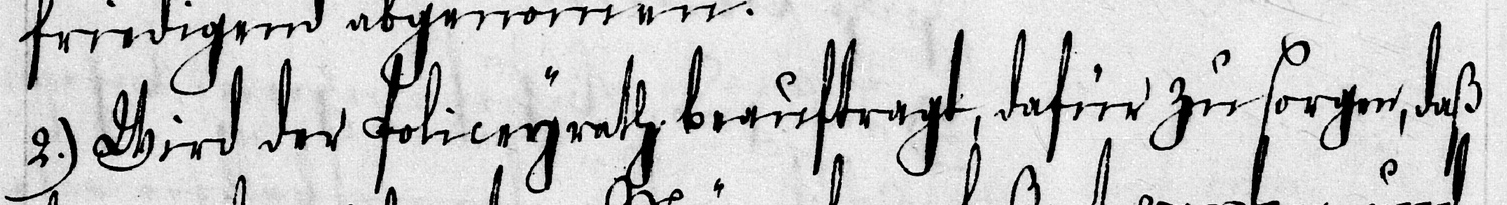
2.) Wird der Policeyrath beauftragt, dafür zu sorgen, daß
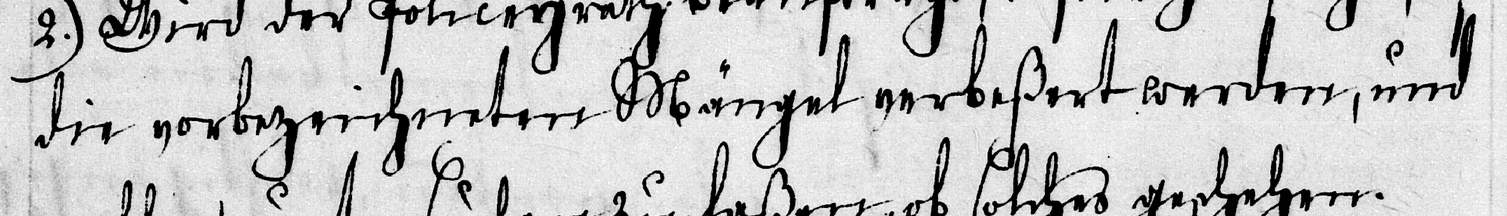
die vorbezeichneten Mängel verbeßert werden, und
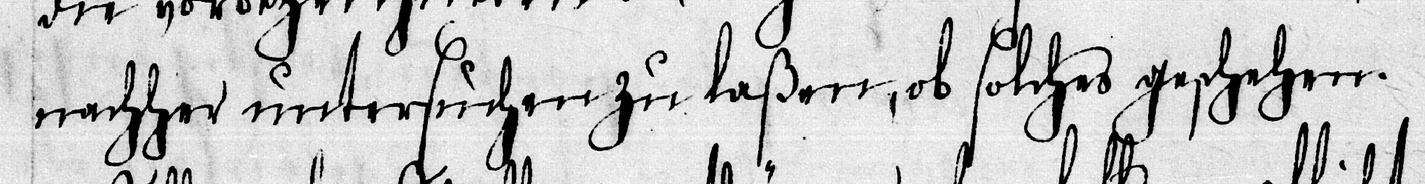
nachher untersuchen zu laßen, ob solches geschehen.
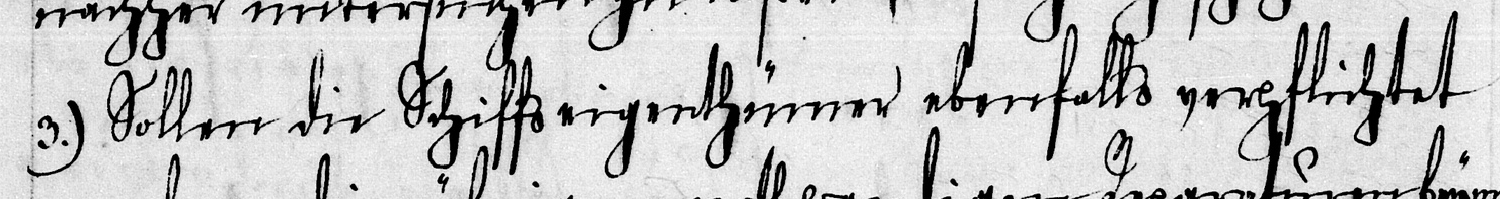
3.) Sollen die Schiffseigenthümer ebenfalls verpflichtet
